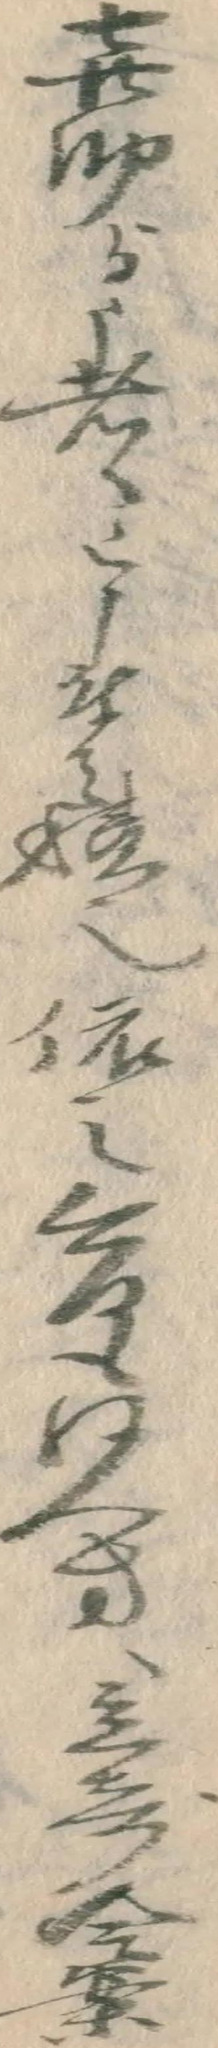喜助与申者へ被申付積也依之今日も同人方へ立寄令案
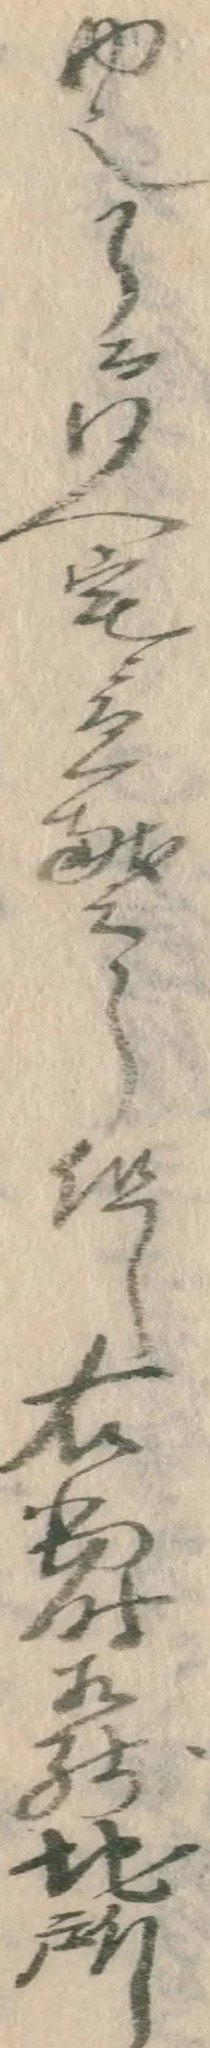内也了而同人宅ニ而一献了但し右當時相残地所
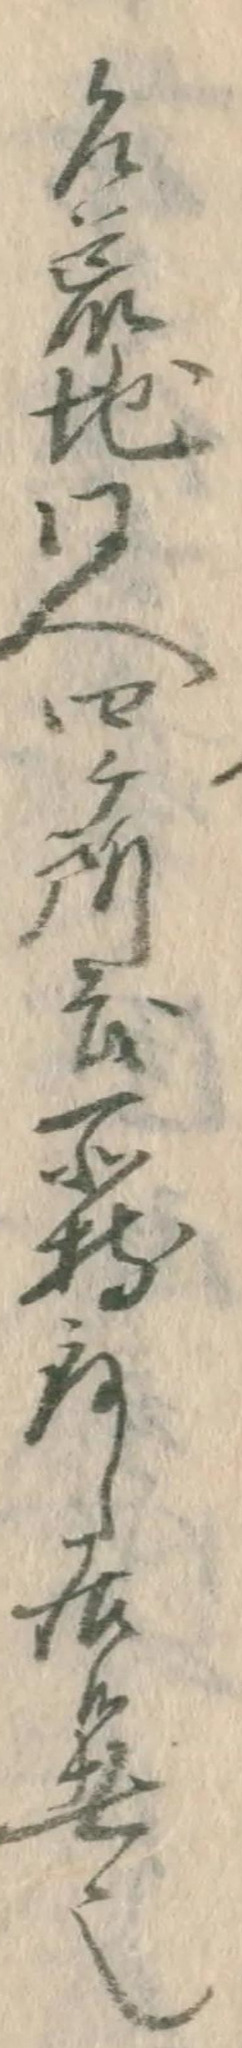乍荒地同人四ケ所も所持致し居候者也
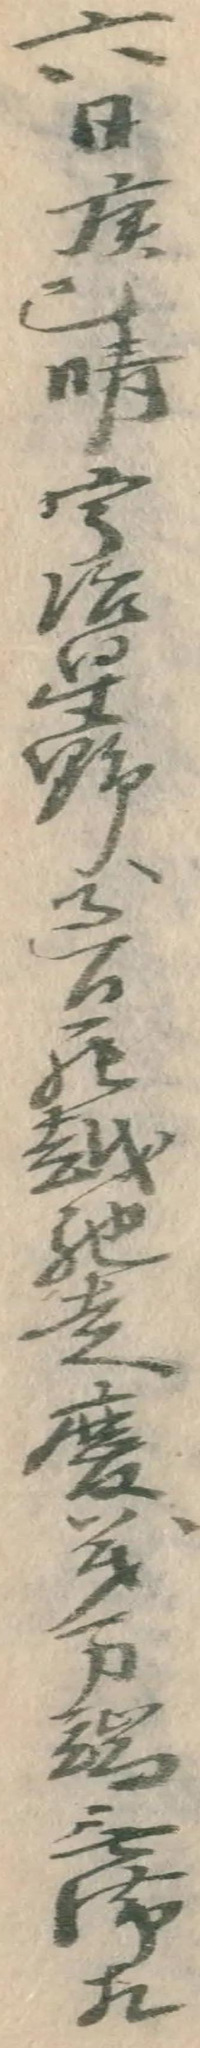六日庚巳晴宇治星野へ過日罷越馳走慶義万端無滞相

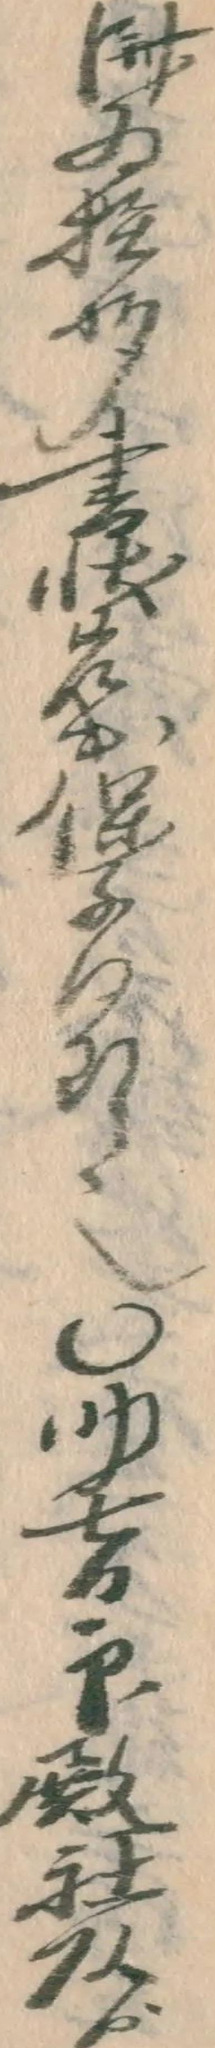済為挨拶書状差出保子同断也○明七日印殿社頭ゟ
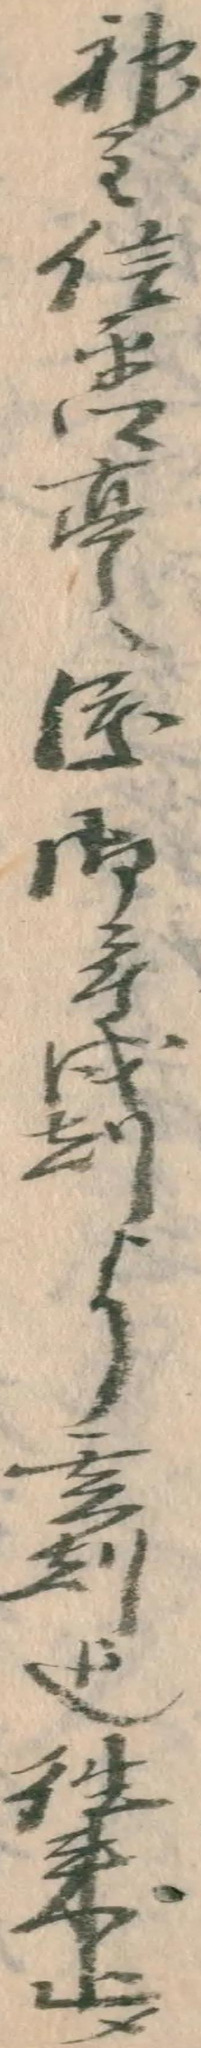神主信平卿亭へ渡御ニ付戌刻より亥刻迄往来止メ
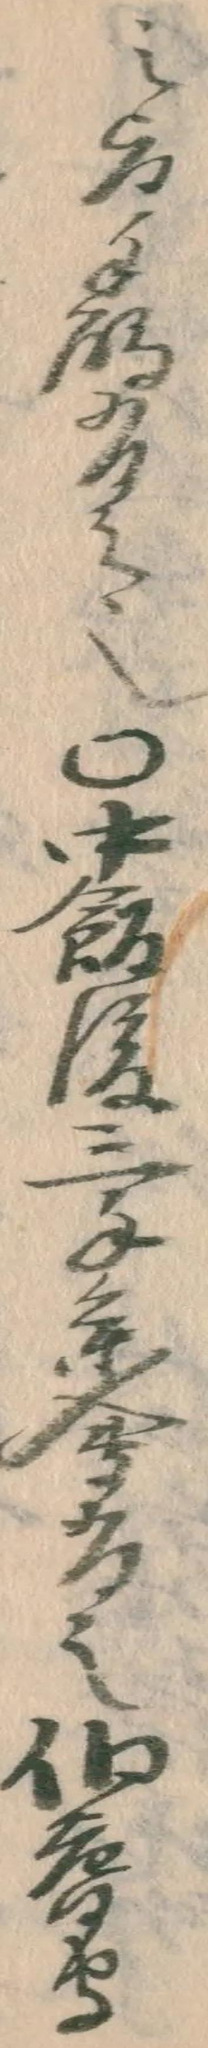之旨手觸有之也○中飯後三手参會有之伯耆守
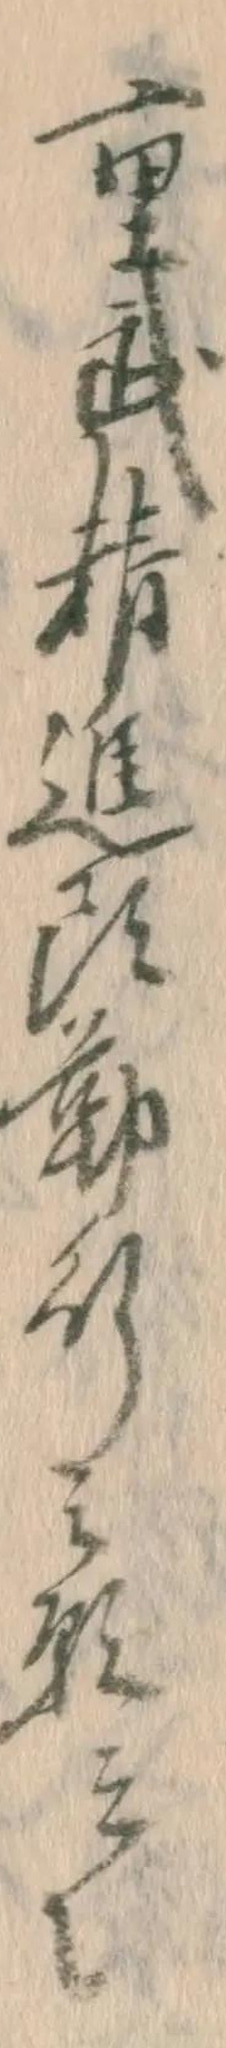重武精進頭勤行之願云々
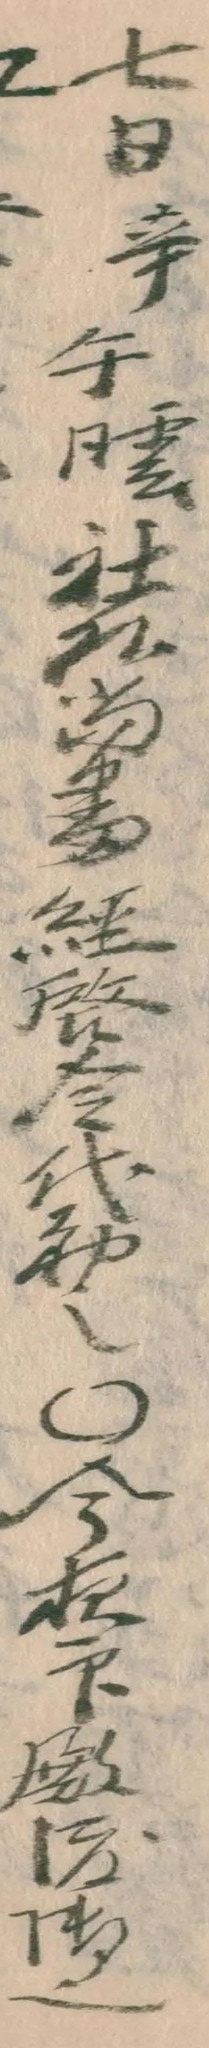七日辛午曇社頭當番経啓令代勤也◯今夜印殿渡御也
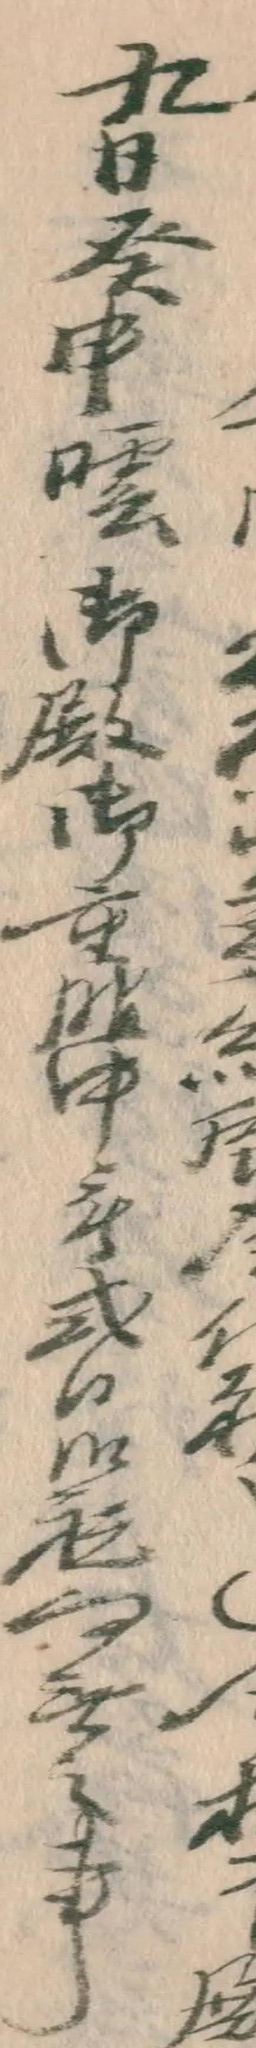九日癸申曇御殿御重服中ニ付式日御祝向無之事
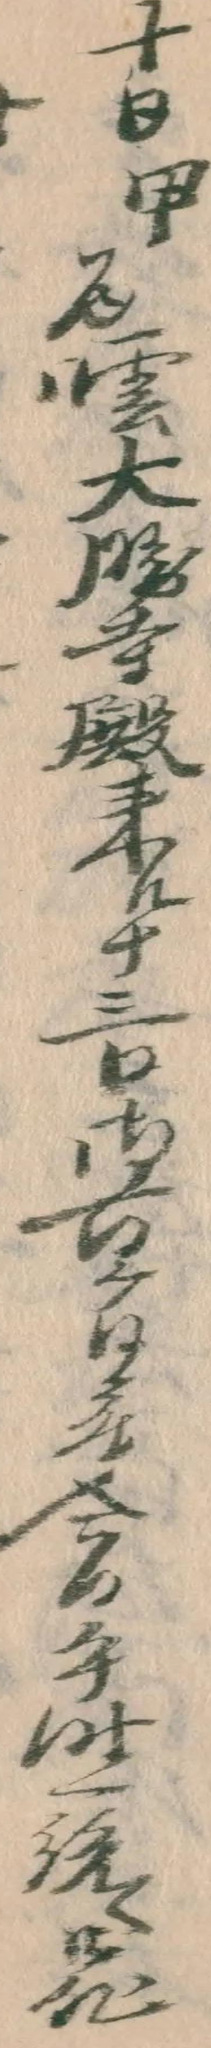十日甲酉曇大勝寺殿来ル十三日御百ヶ日ニ付今日午時一統へ御
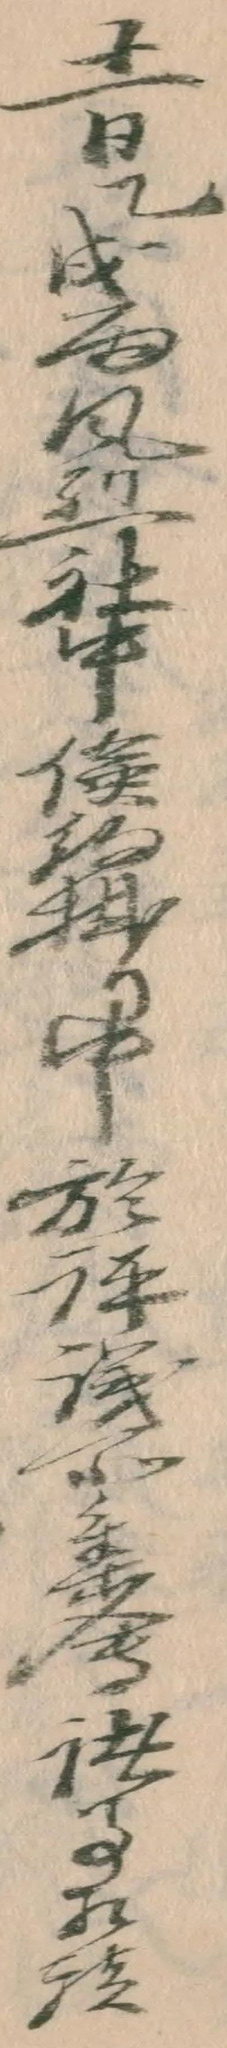十一日乙戌雨風烈社中倹約掛り中於評議所集會諸事相続
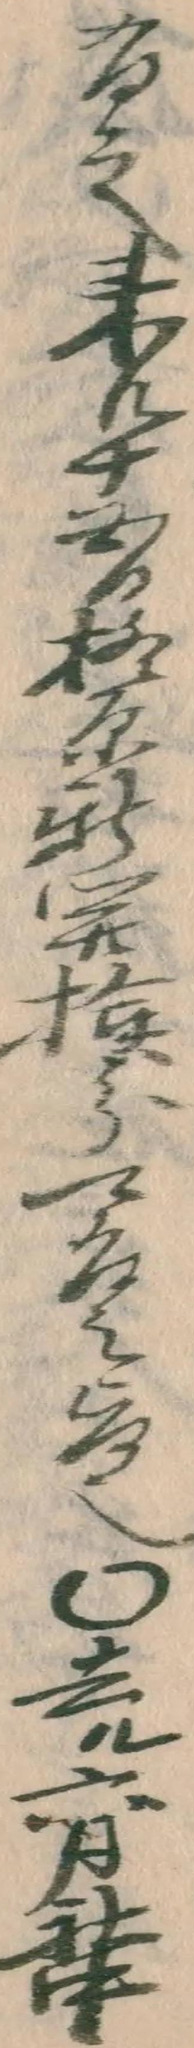有之来ル十五日柊原新開検分可有之旨也○去ル六月社中
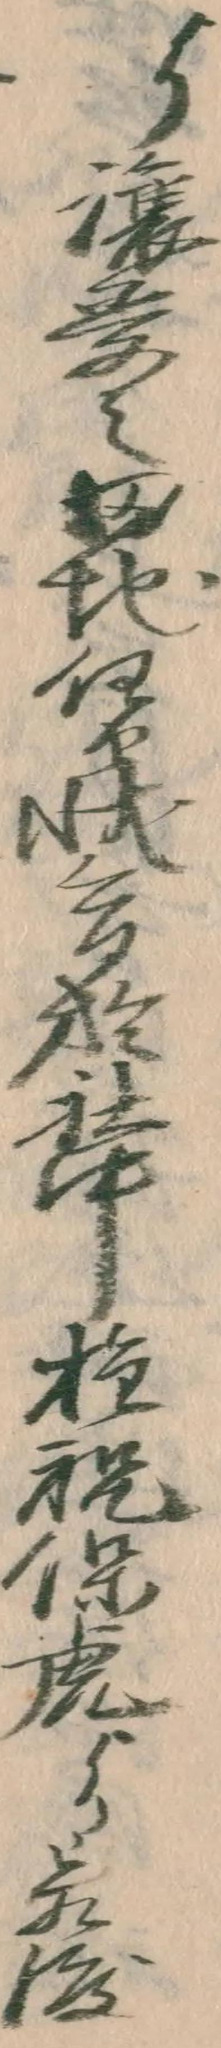了譲受之田地任セ状今日於社中権祝保虎より被相渡
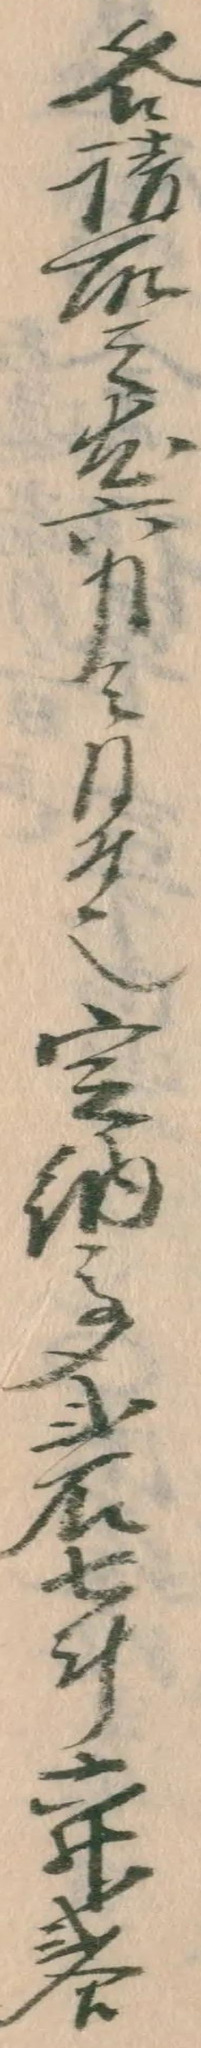各請取之尤六月之目付也定納高〆弐石七斗六升弐合
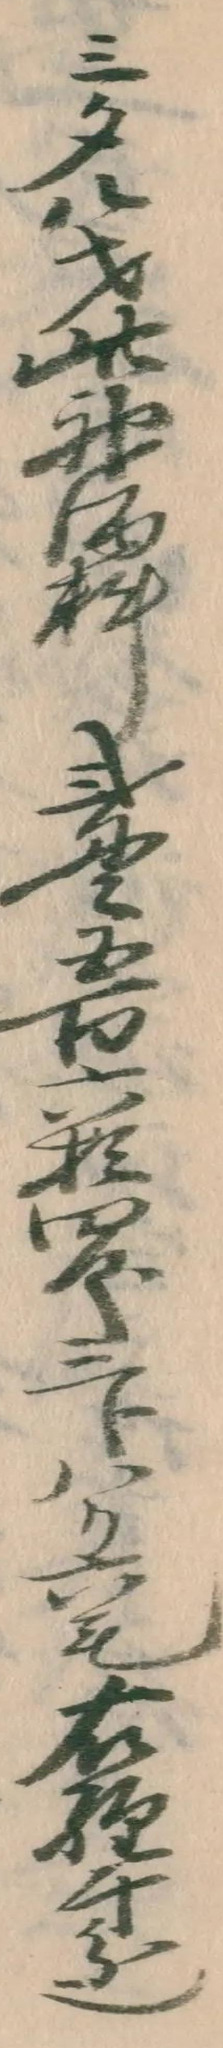三タ八才此神酒料弐貫五百六拾四匁三分八り六毛右経千分也
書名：賀茂社記録. 第67冊
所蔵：国立国会図書館 National Diet Library, JAPAN
